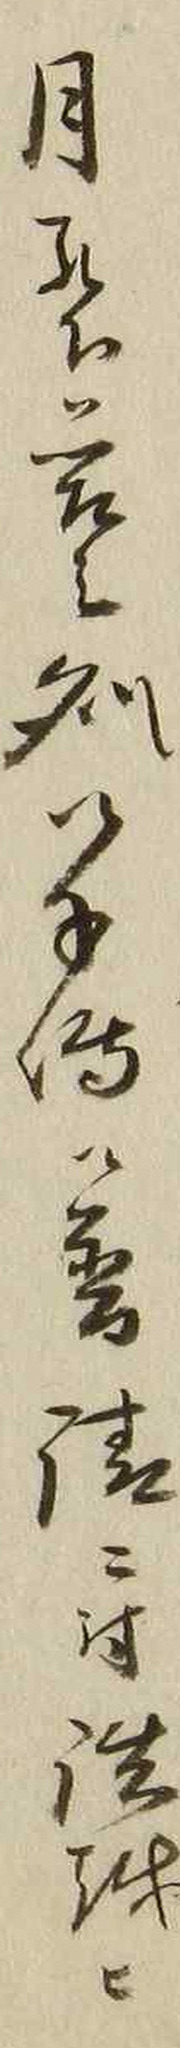月罷下節処御手伝御普請ニ付詰越被
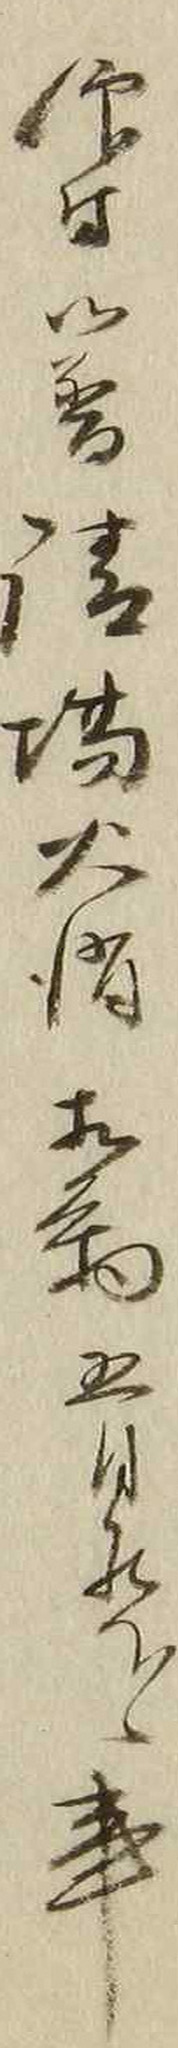仰付御普請場火消相勤五月罷下候事
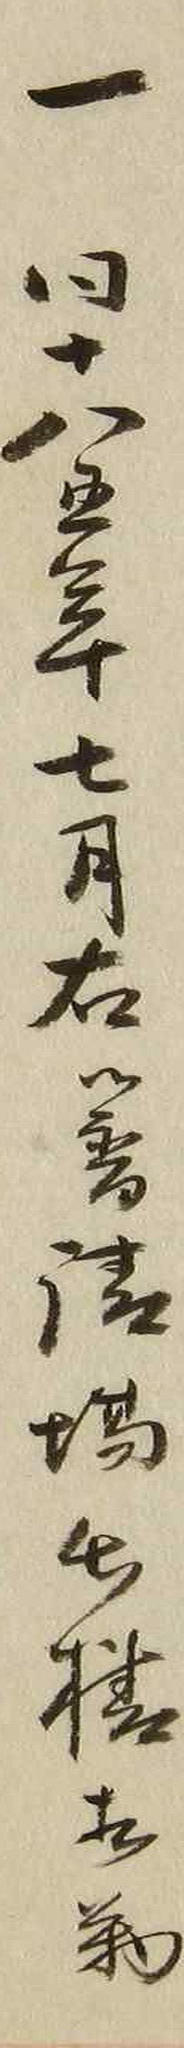一同十八丑年七月右御普請場出精相勤
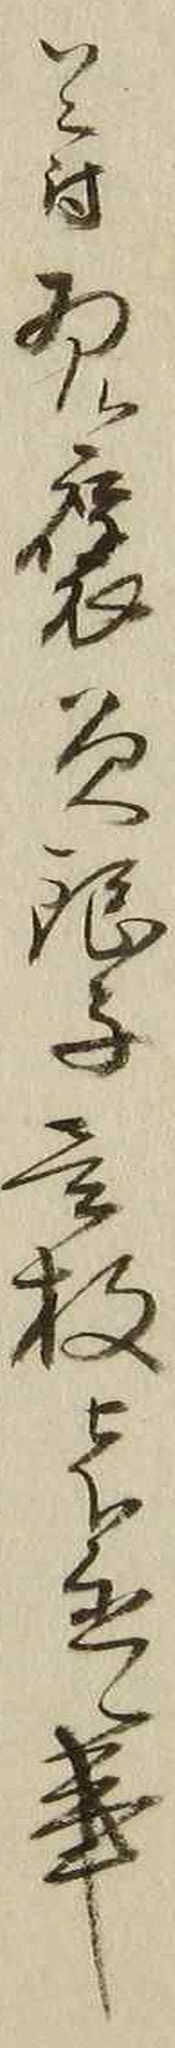候ニ付為御褒美銀子壱枚被下置候事
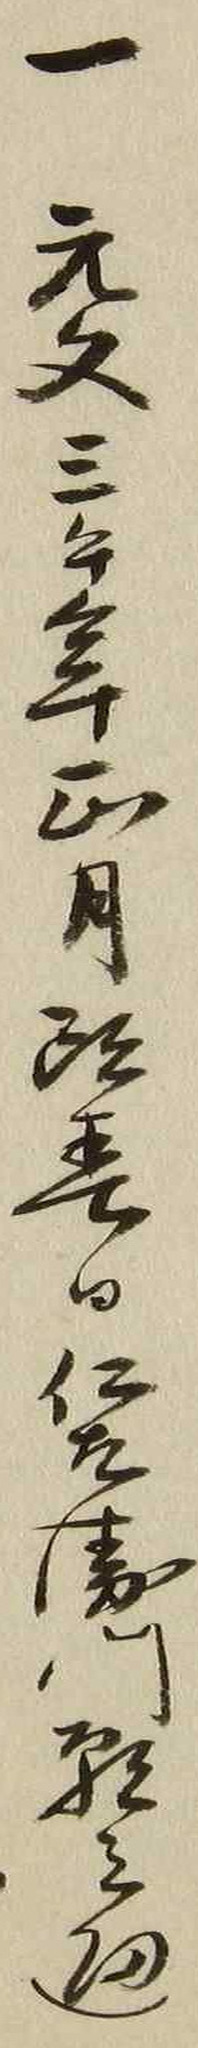一元文三午年正月頭春日仁左衛門願之通
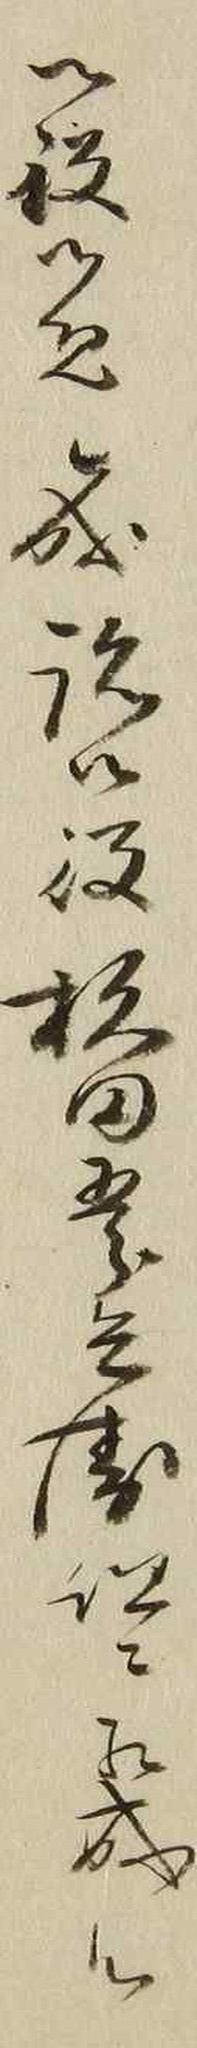御役御免被成跡御役杉田五郎兵衛組ニ罷成候
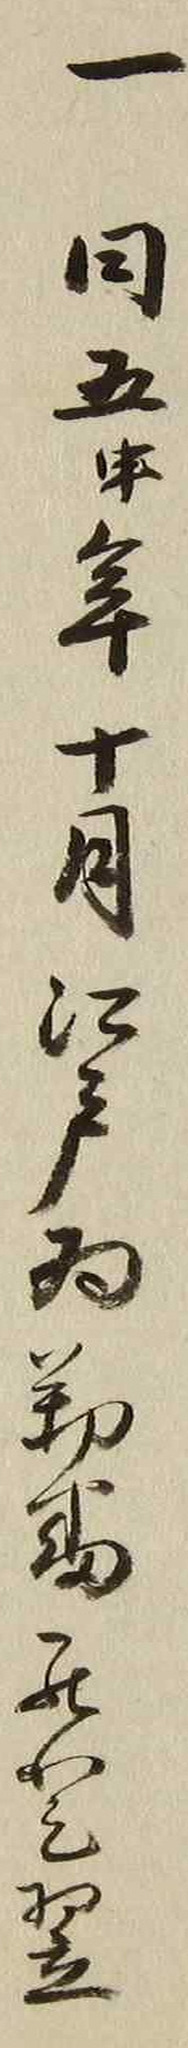一同五申年十月江戸為勤番罷登翌
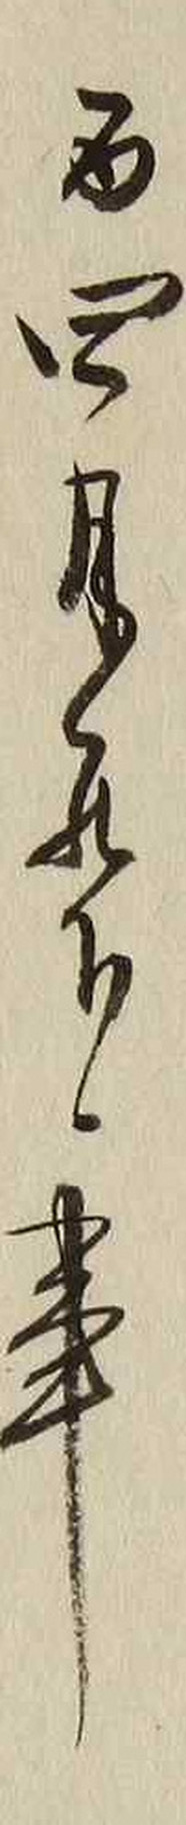酉四月罷下候事
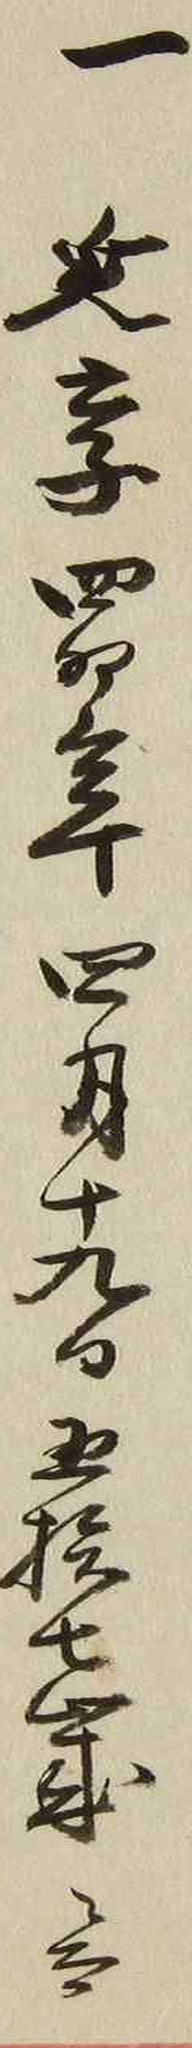一延享四卯年四月十九日五拾七歳ニ而
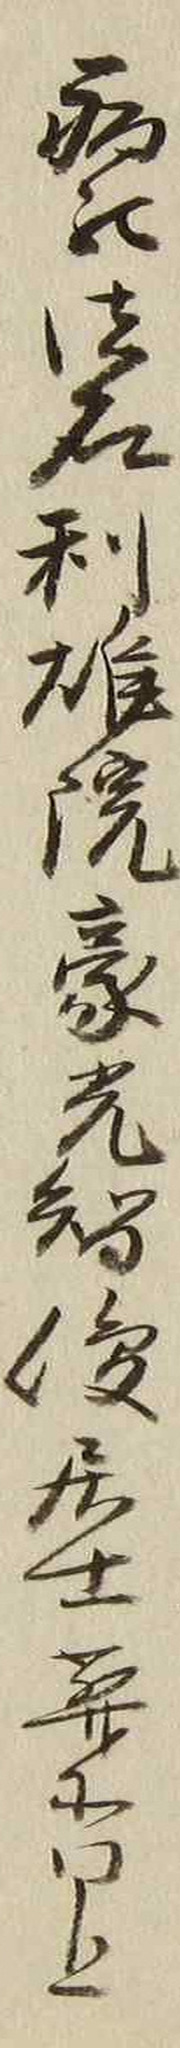病死法名利雄院豪光智俊居士葬所同上
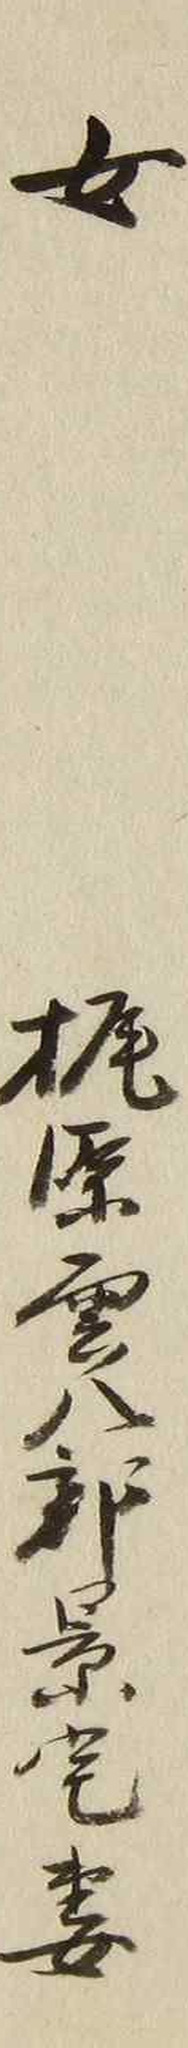女梶原雲八郎景宅妻
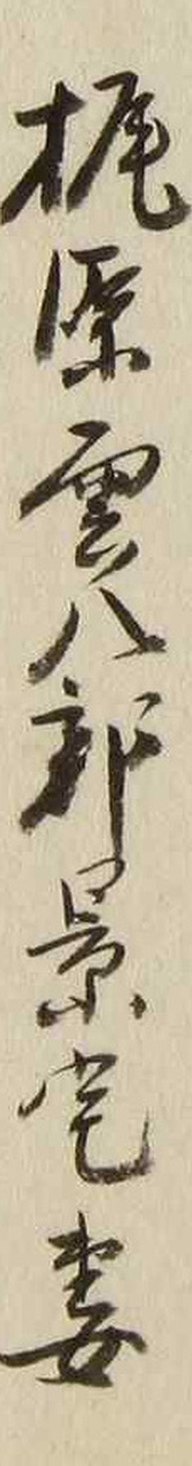女梶原雲八郎景宅妻
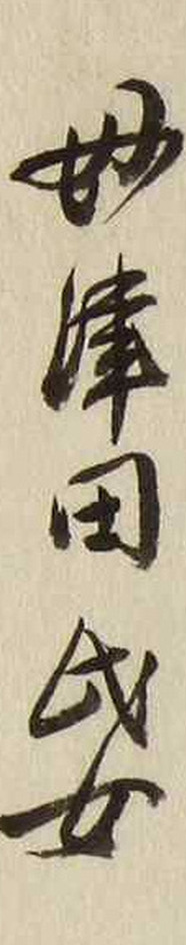母津田氏女
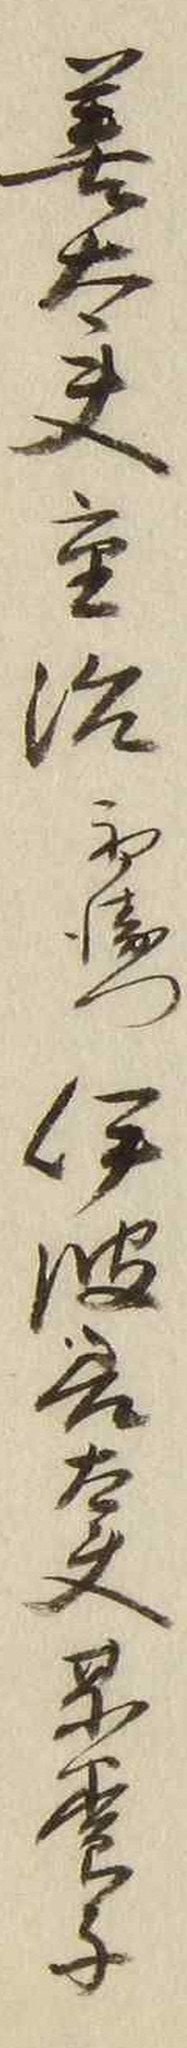善太夫重治初衛門伊波善太夫某養子

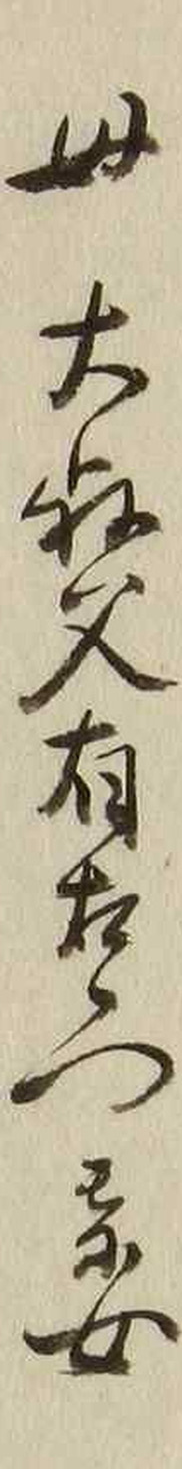母大叔父有右衛門某女
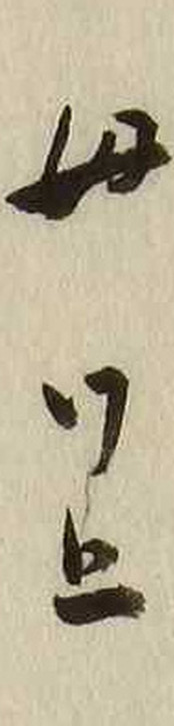母同上
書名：諸士系譜　巻之311　し之部1
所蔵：会津若松市立会津図書館
